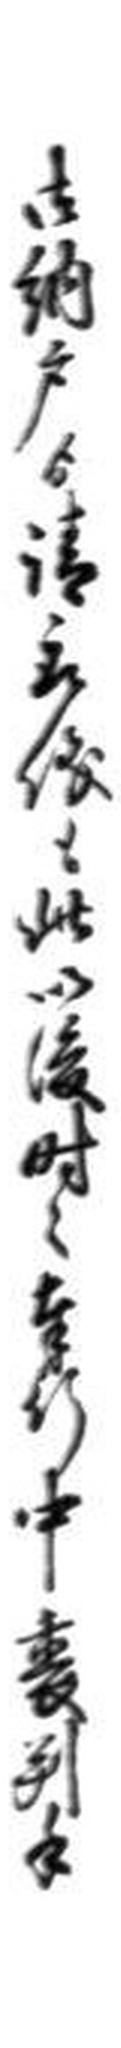御納戸ゟ請取儀も此以後時々奉行中裏判手
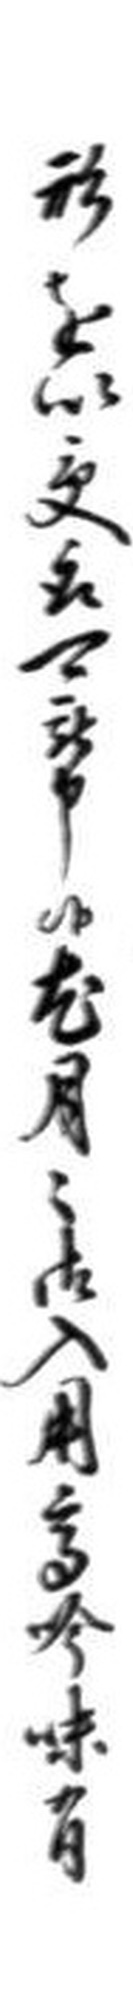形を以受取可被申候尤月々御入用高吟味有
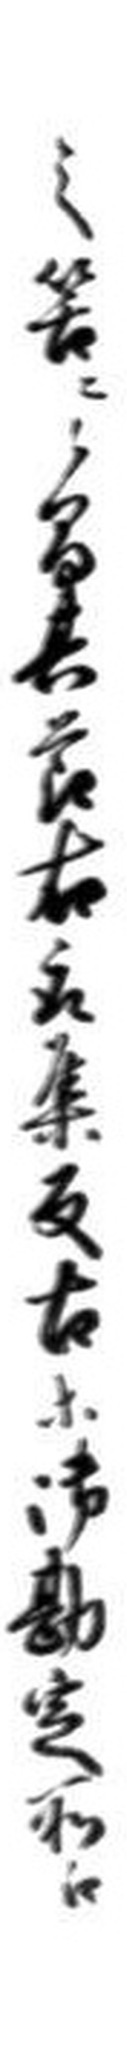之筈ニ候間其節右取集反古等御勘定所江
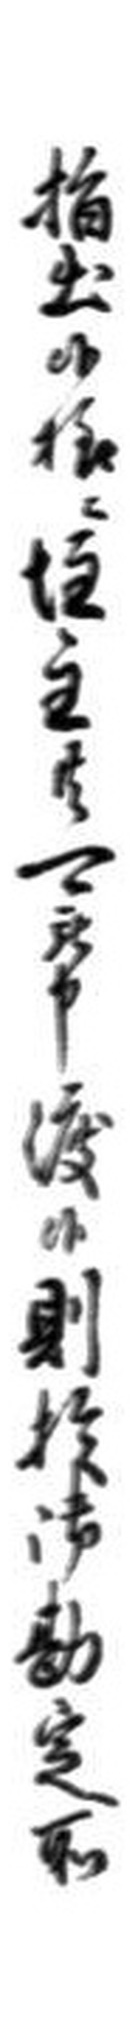指出候様ニ坊主共可被申渡候則於御勘定所
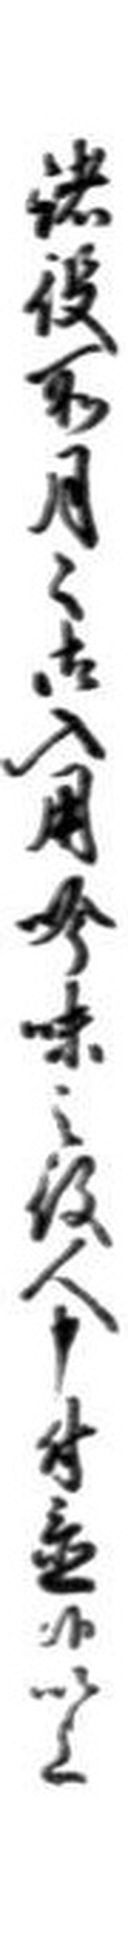諸役所月々御入用吟味之役人申付置候以上
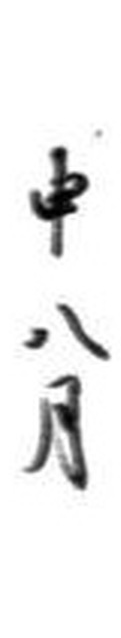申八月
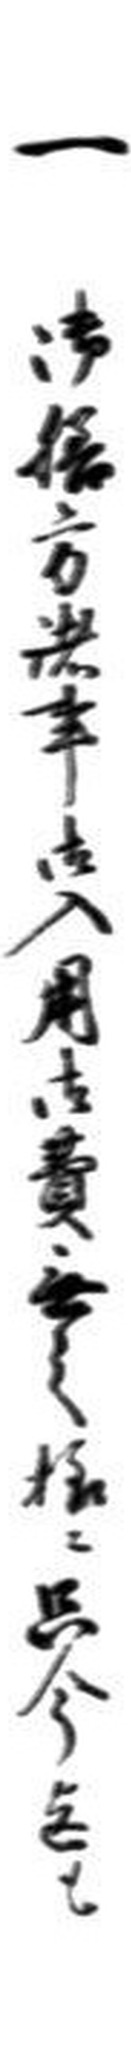一御膳方諸事御入用御費無之様ニ只今迄も
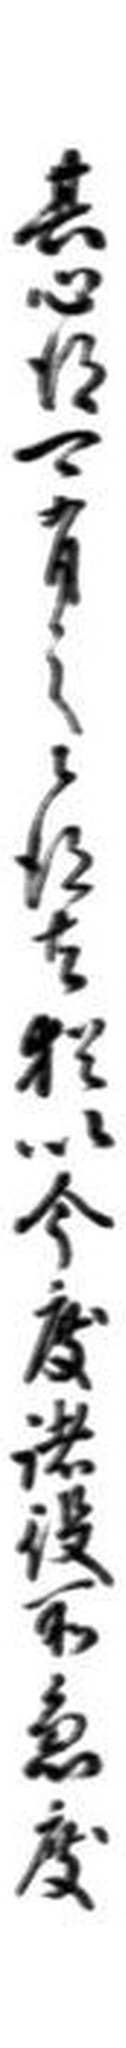其心得可有之候得共猶以今度諸役所急度

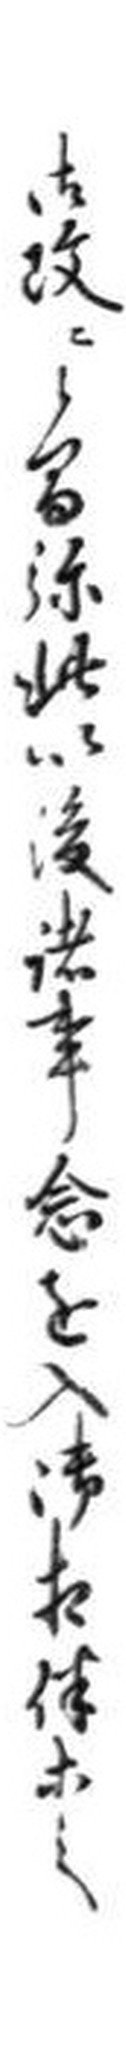御改ニ候間弥此以後諸事念を入御相伴等之
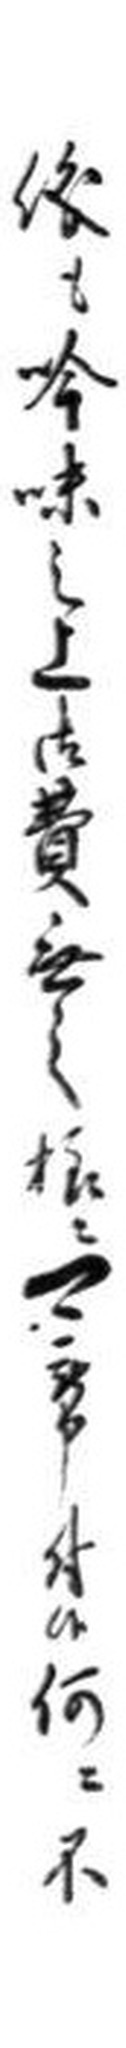儀も吟味之上御費無之様ニ可被申付候何ニ不
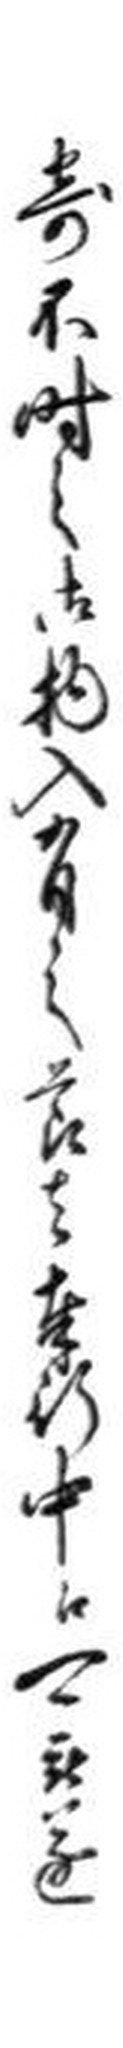寄不時之御物入有之節者奉行中江可被遂
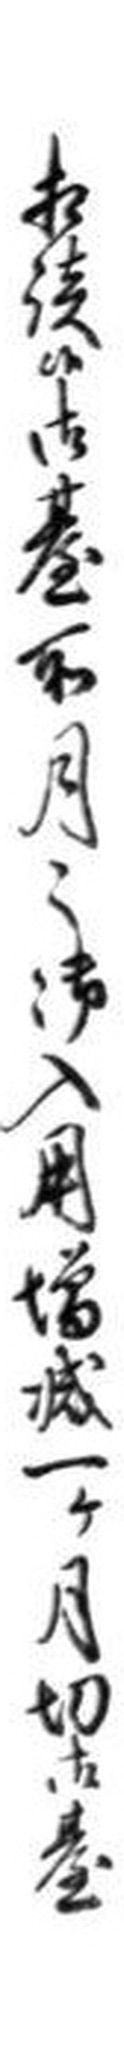相談候御台所月々御入用増減一ヶ月切御台
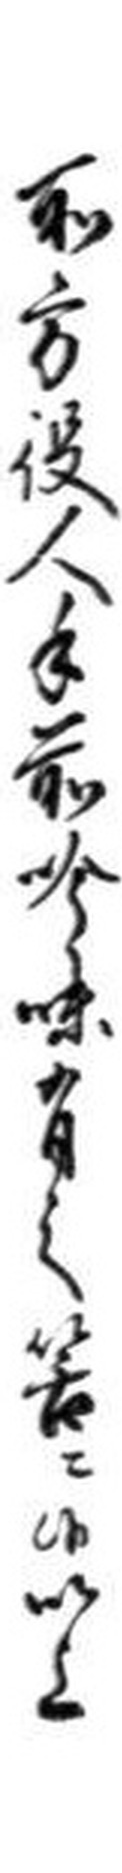所方役人手前吟味有之筈ニ候以上
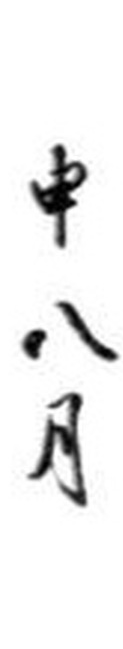申八月
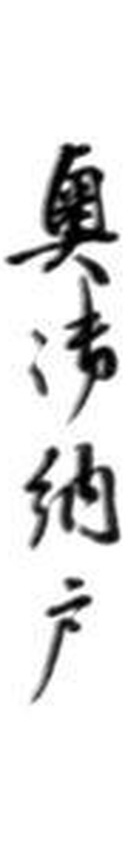奥御納戸
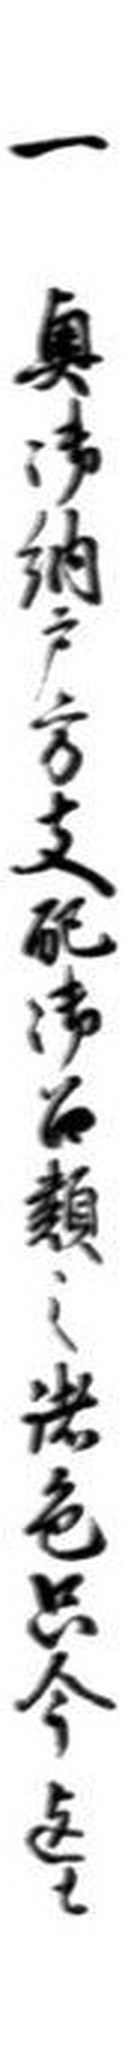一奥御納戸方支配御召類之諸色只今迄も
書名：家譜 三十一 吉邦公 享保元年
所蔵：福井県文書館 Fukui Prefectural Archives
